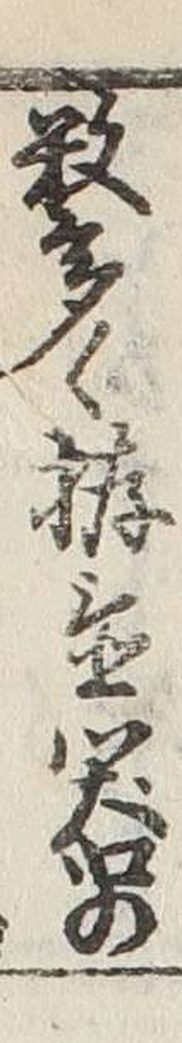数多く拵置器の
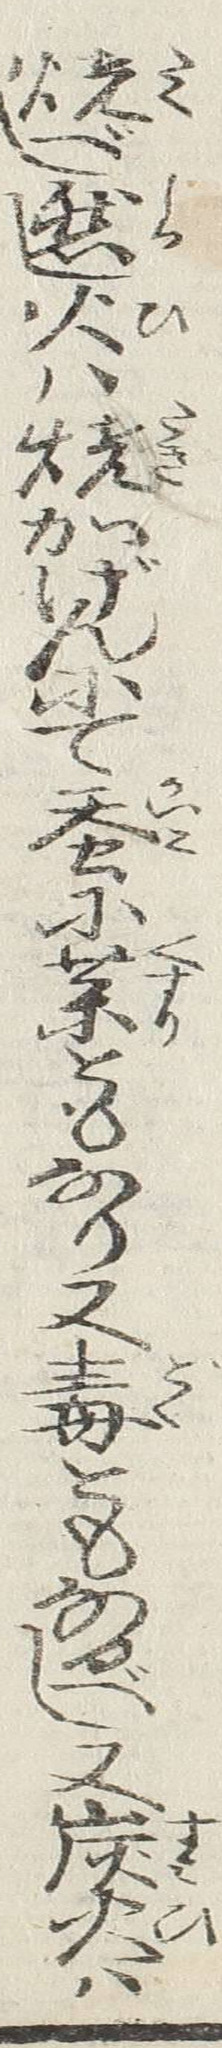焼べし然し火は焼かげんにて蚕に薬ともなり又毒ともなるべし又炭火は
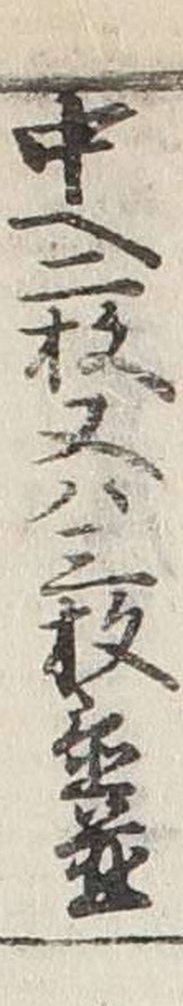中へ二枚又は三枚置並
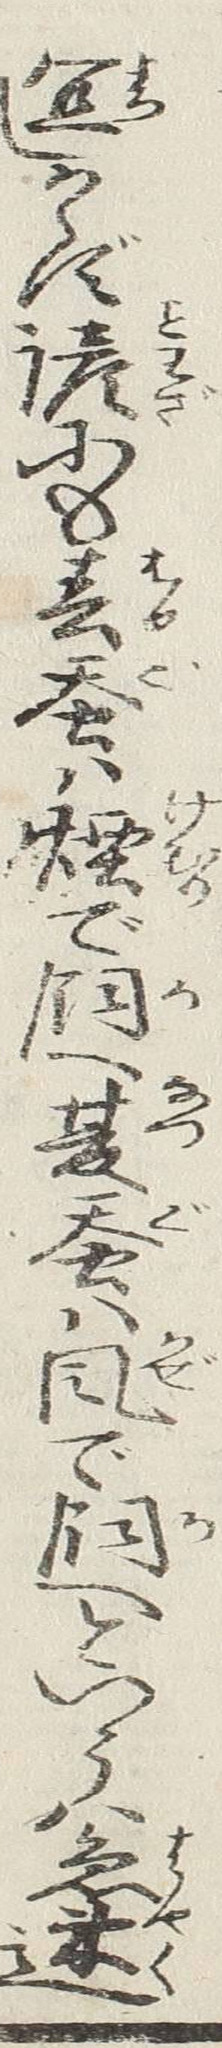宜しからず諺にも春蚕は煙で飼へ夏蚕は風で飼へというは急速
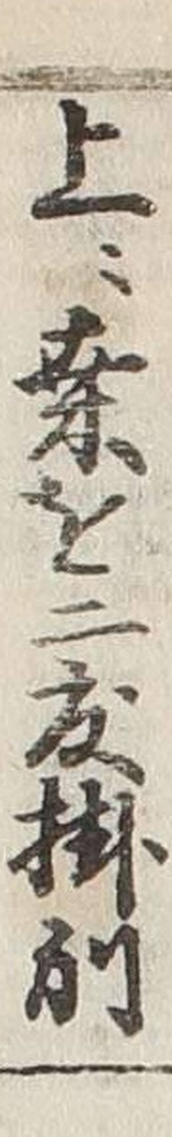上に桑を二度掛別
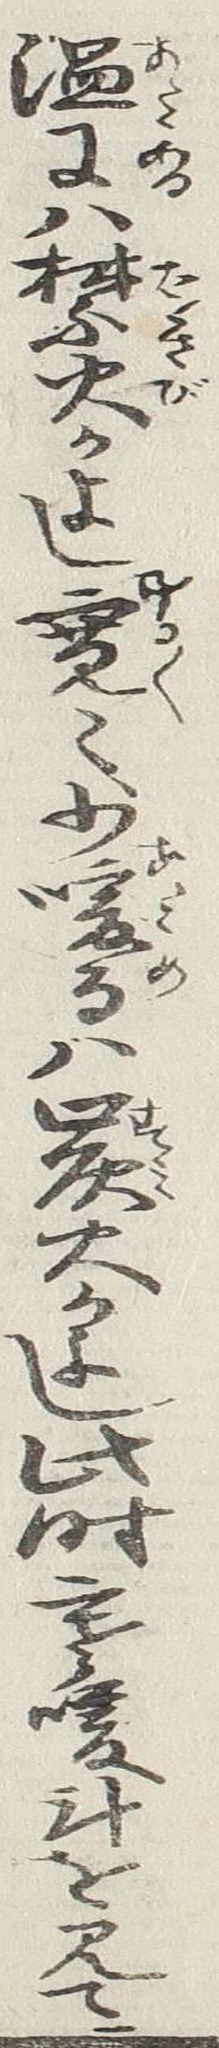温には焚火かよし寛々少暖るは炭火かよし此時寒暖計を見て
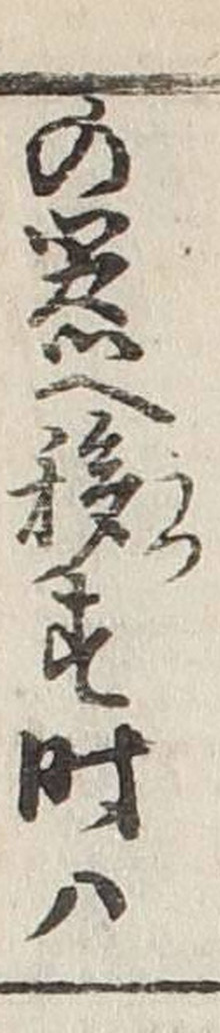の器へ移す時は
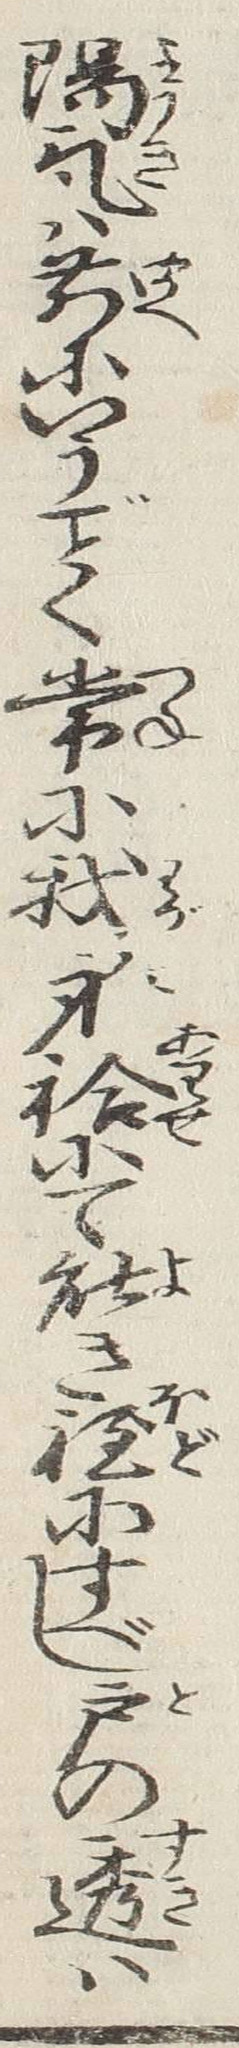陽気は前にいうごとく常に我身袷にて能き程にすべし戸の透は

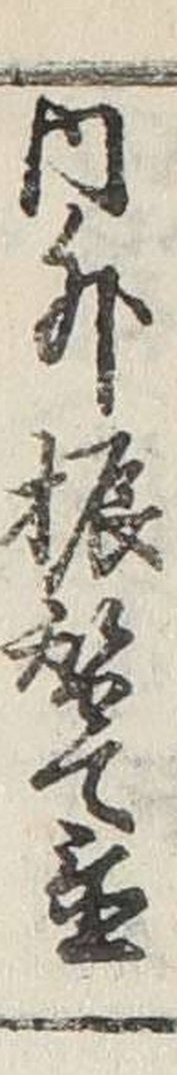内外振替て置
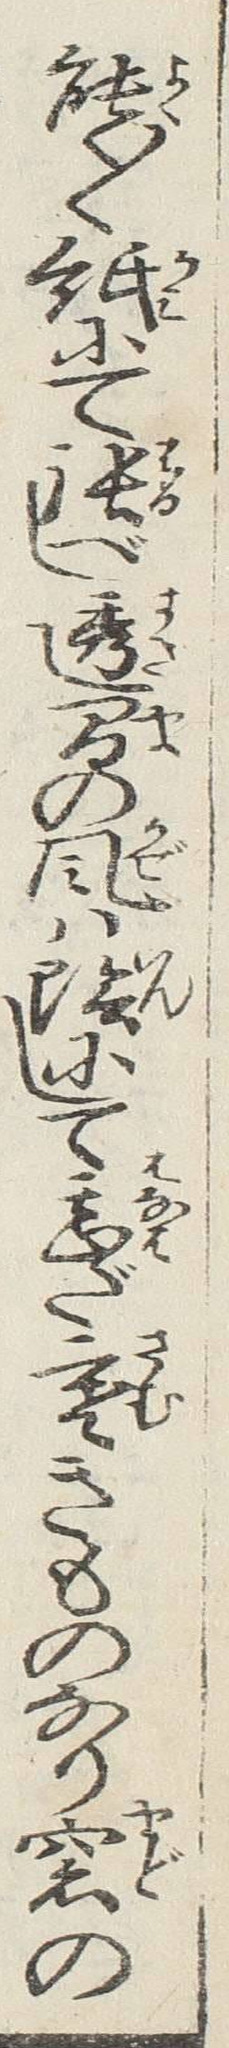能く〳〵紙にて張べし透間の風は陰にして甚だ寒きものなり窓の
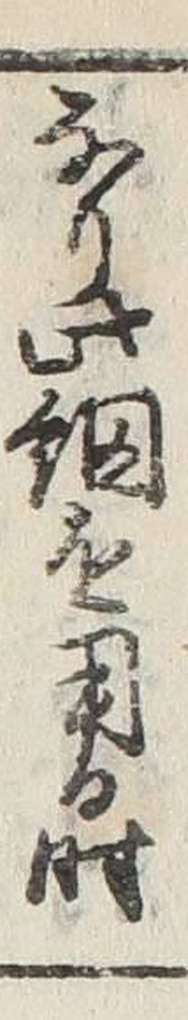なり此網を用る時
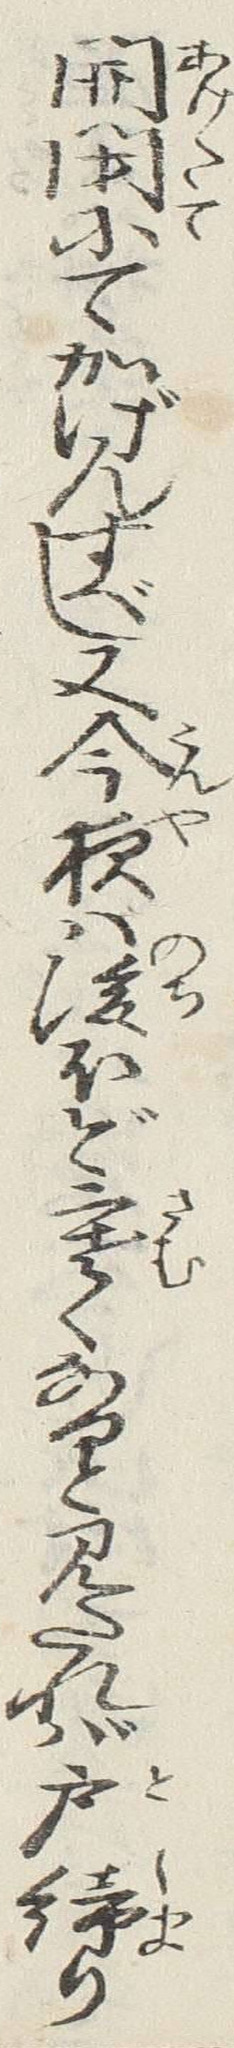開閉にてかげんすべし又今夜は後ほど寒くなると見たれば戸締り
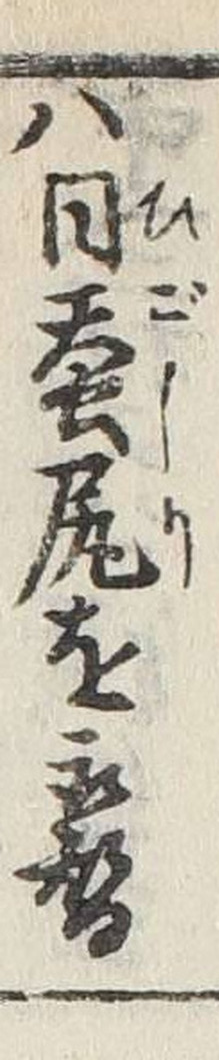は日蚕尻を取替
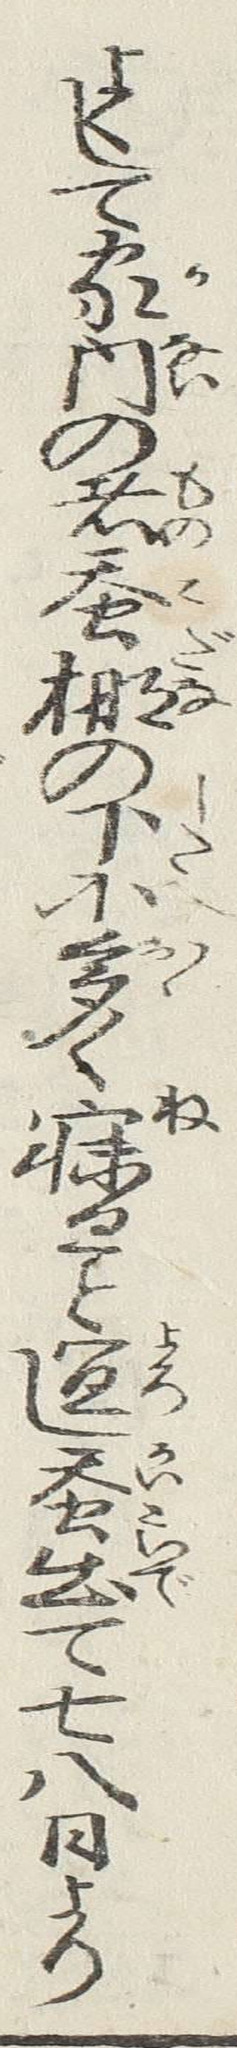よくして家内の者蚕棚の下に多く寝ること宜し蚕出て七八日より
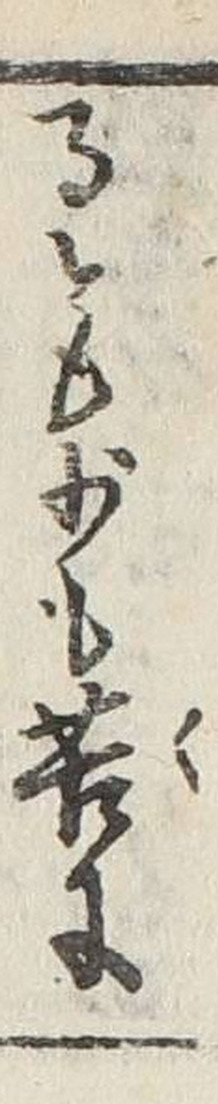るとも少も苦に
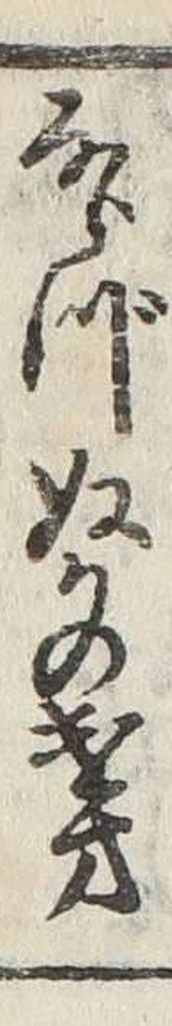ならづぬかの遣方
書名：養蠶實驗録
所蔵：東京大学農学生命科学図書館 国文学研究資料館
